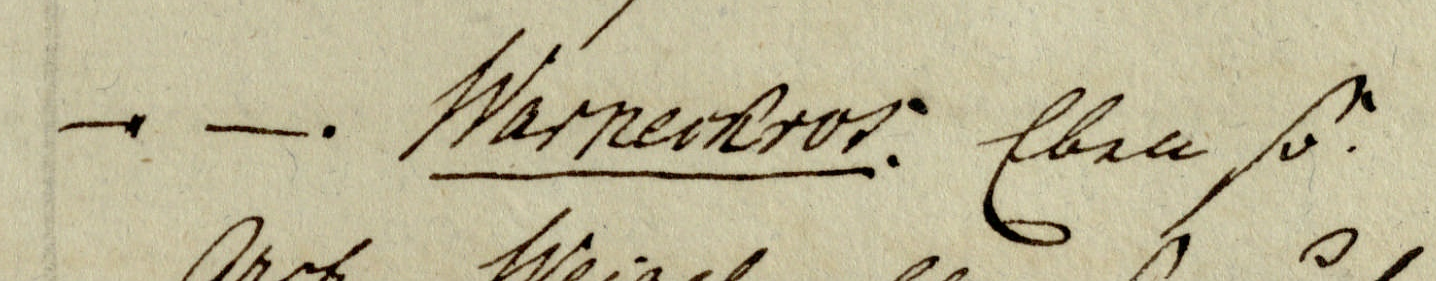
Warneckros. Eben so.
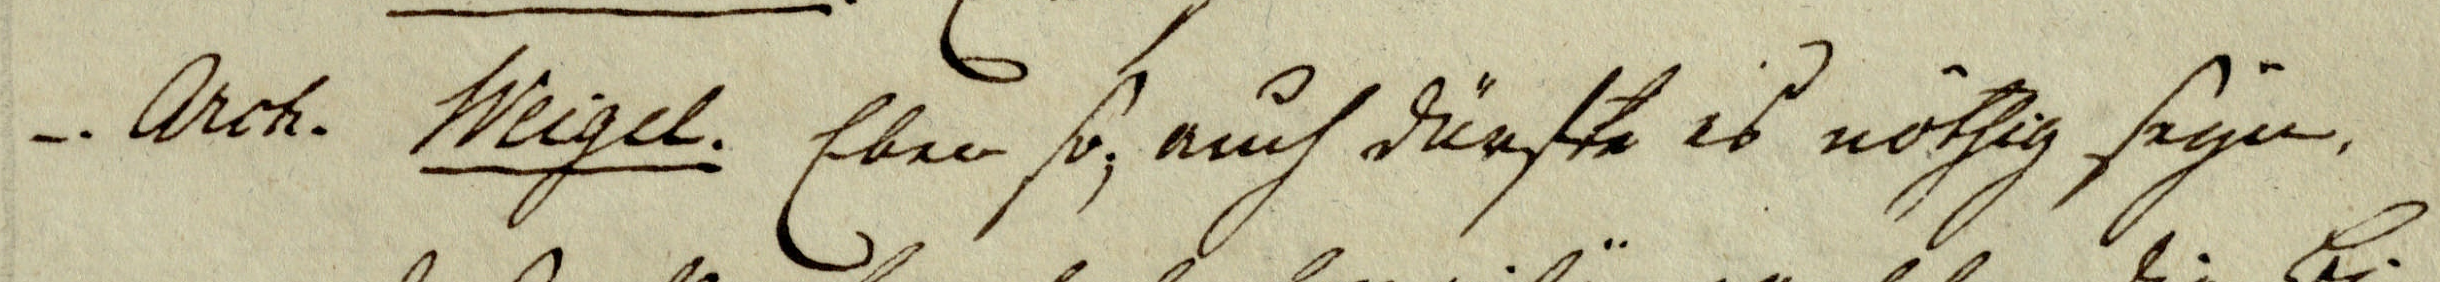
Arch. Weigel. Eben so, auch dürfte es nöthig seÿn,
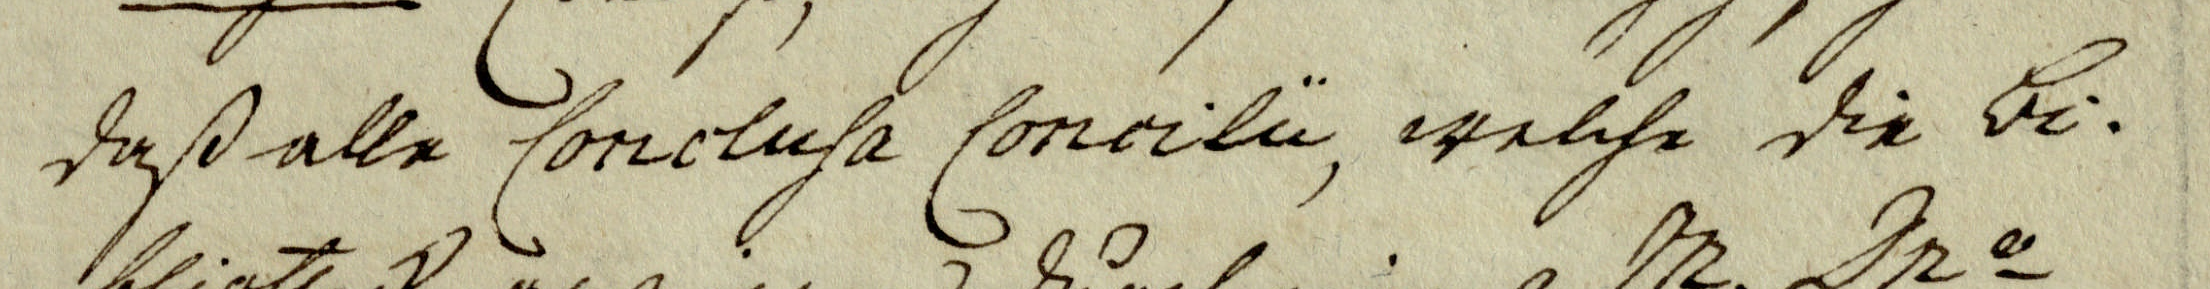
daß alle Conclusa Concilii ,welche die Bi¬
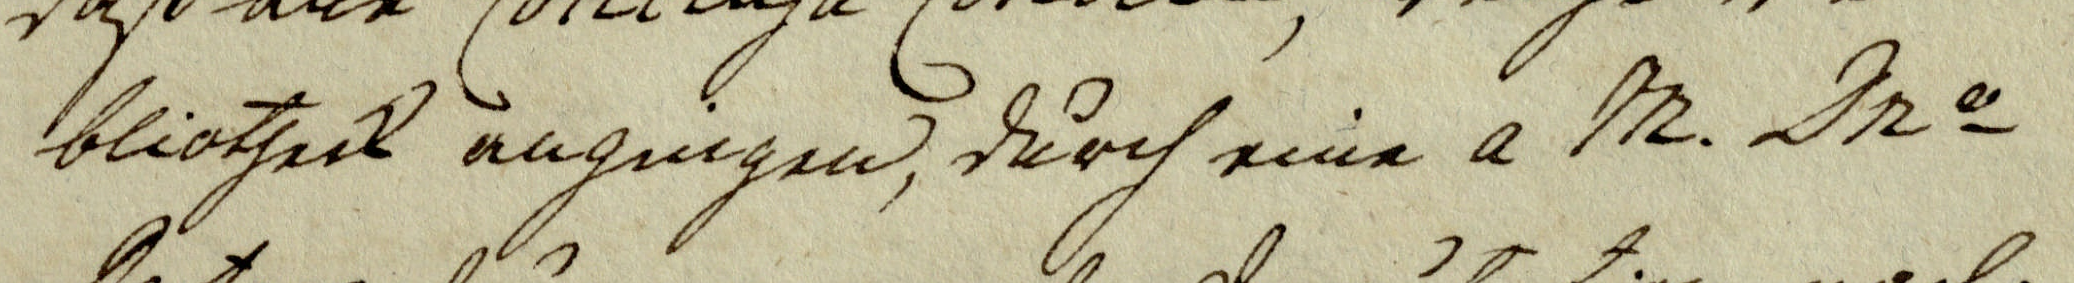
bliotheck angingen, durch eine a M. Dn
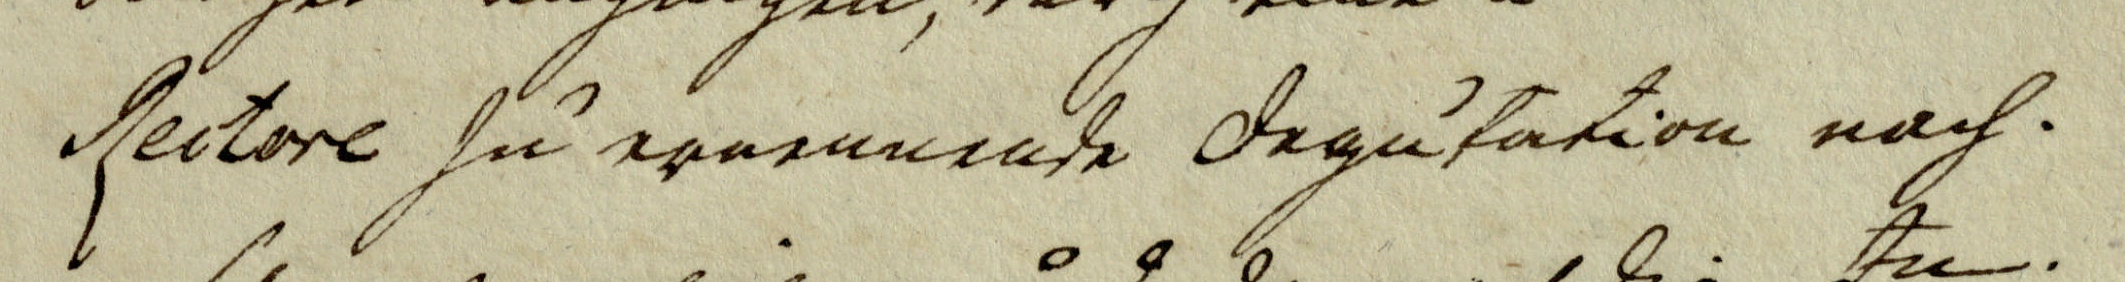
Rectore zu ernennende Deputation nach¬
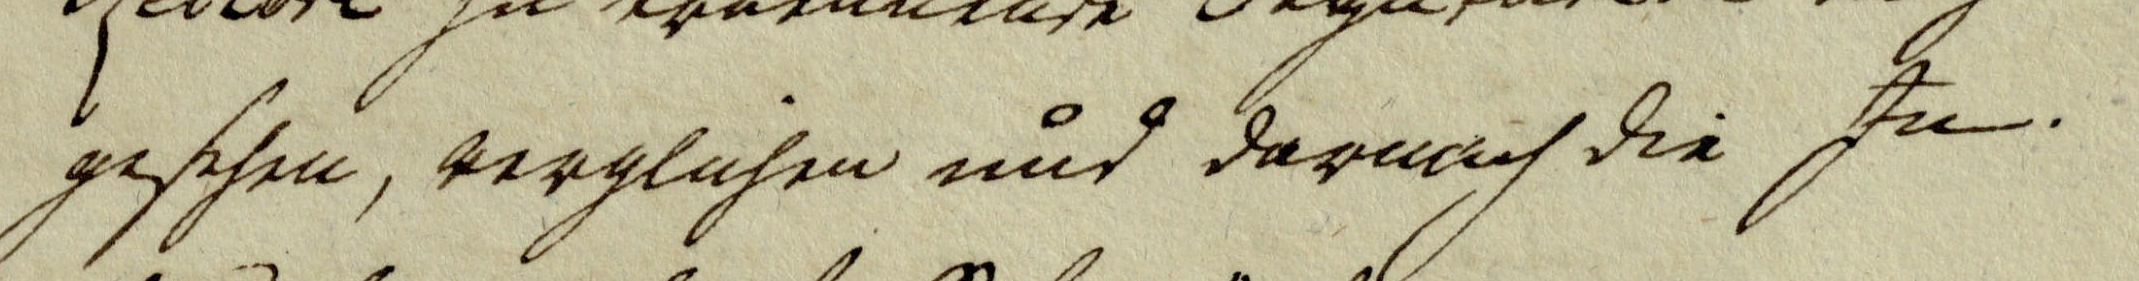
gesehen, verglichen und darnach die In¬
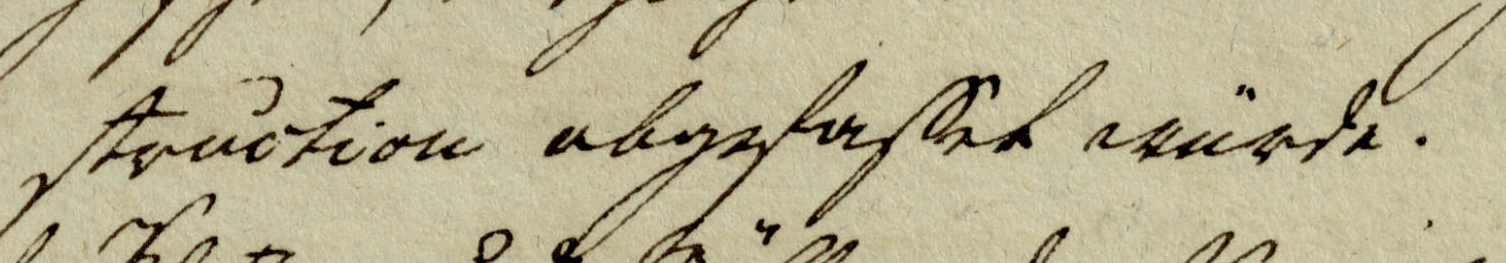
struction abgefasset würde.
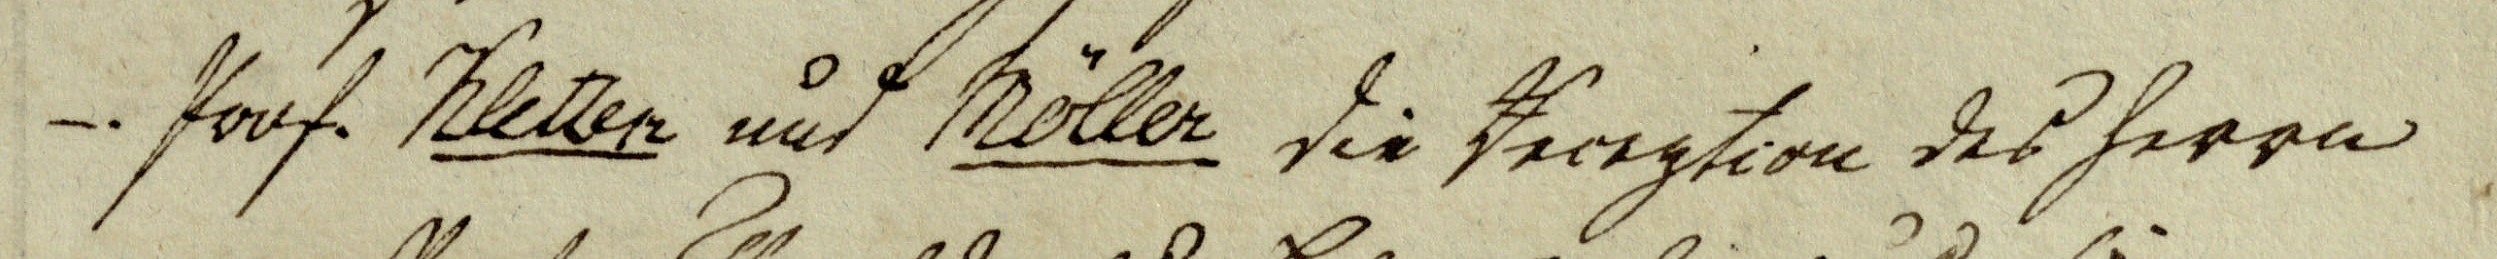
Prof. Kletten und Möller die Reception des Herrn
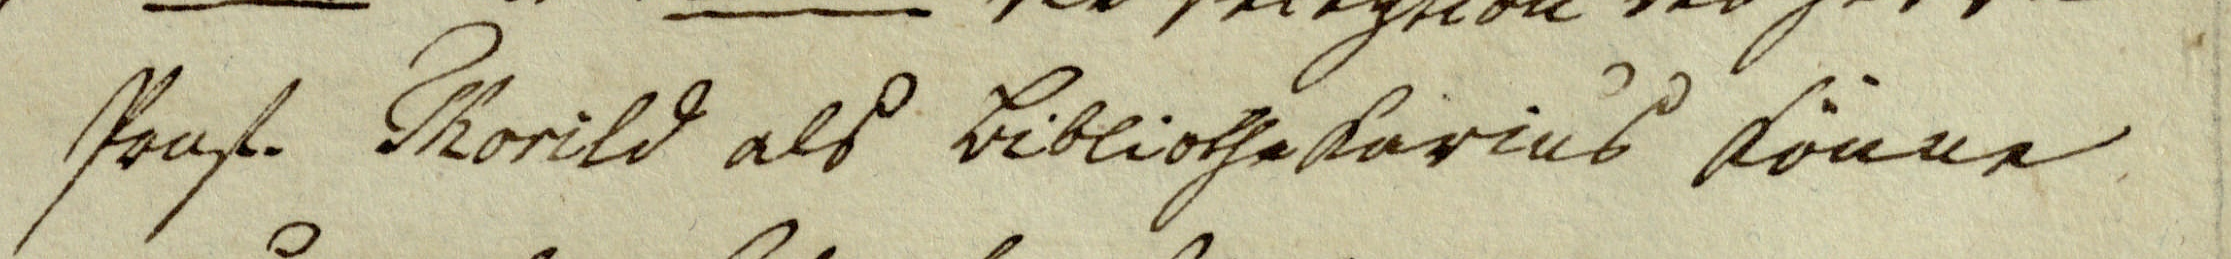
Prof. Thorild als Bibliothekarius könne
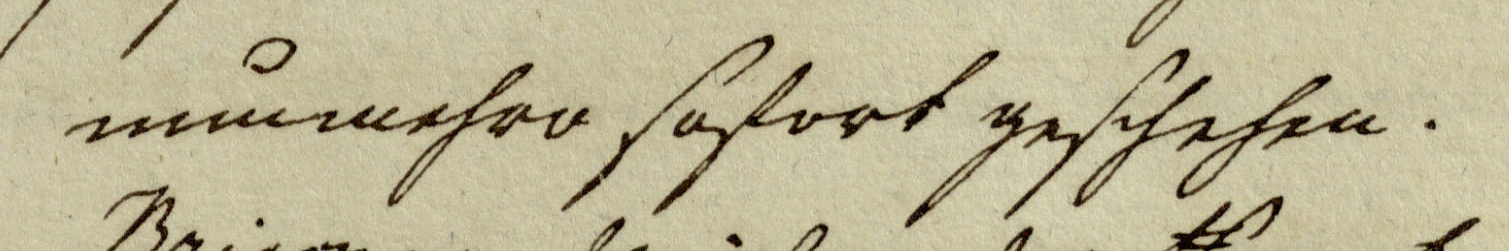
nunmehro sofort geschehen.
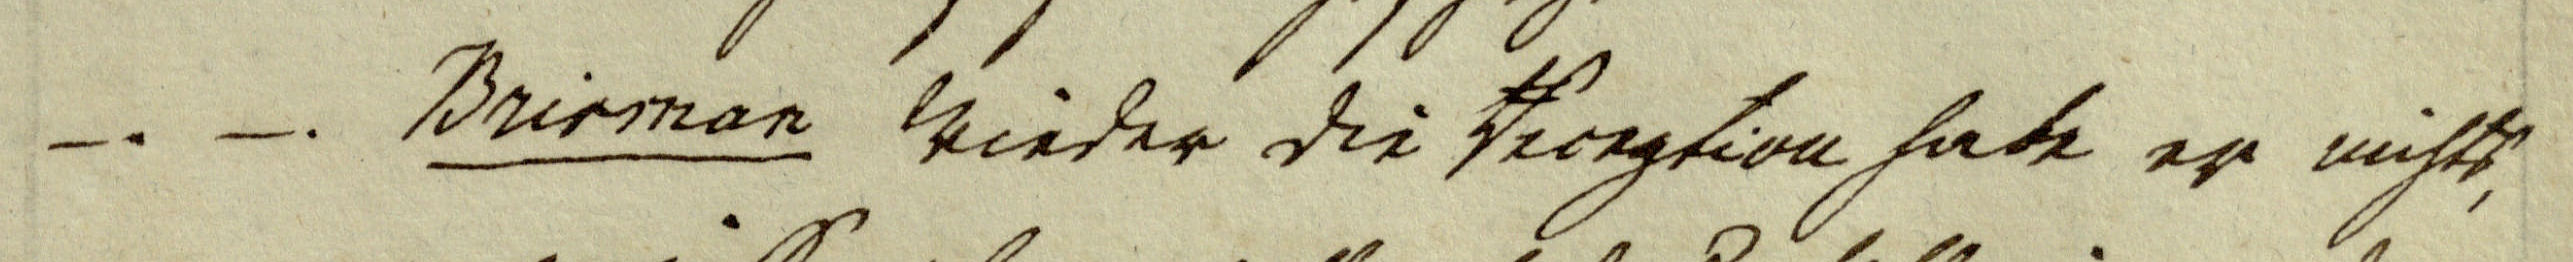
Brisman. Wieder die Reception habe er nichts,
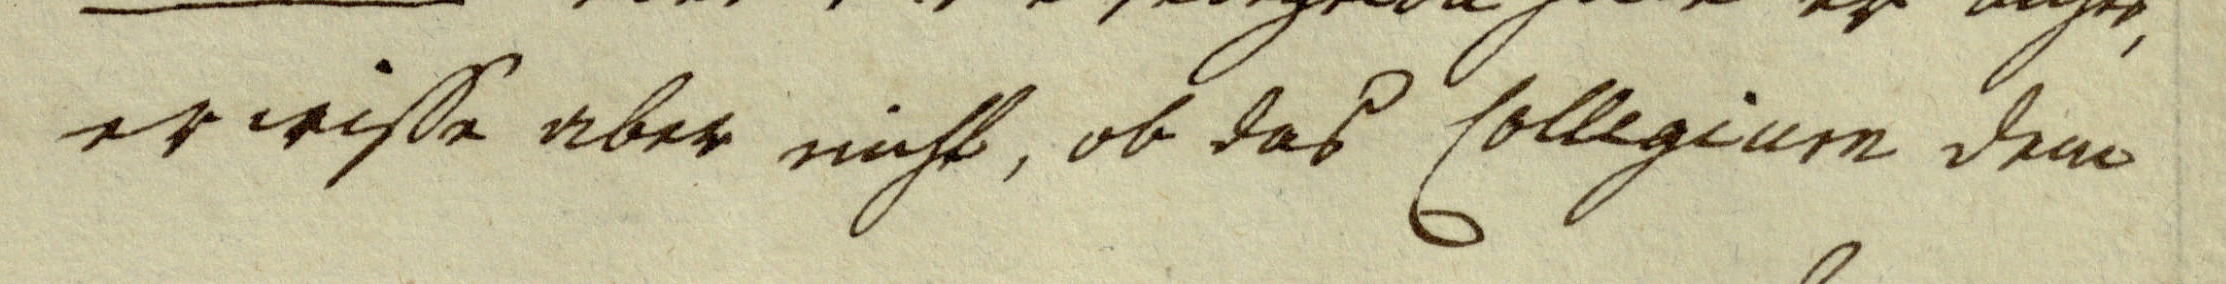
er wisse aber nicht, ob das Collegium dem
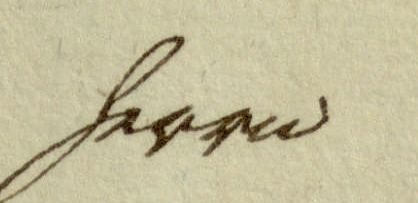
Herrn
